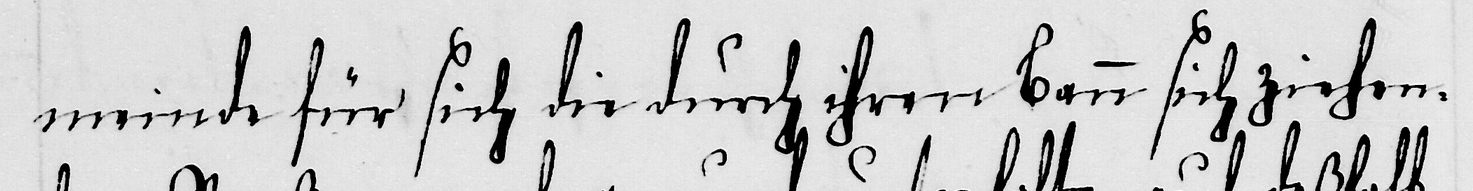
meinde für sich die durch ihren Bann sich ziehen¬
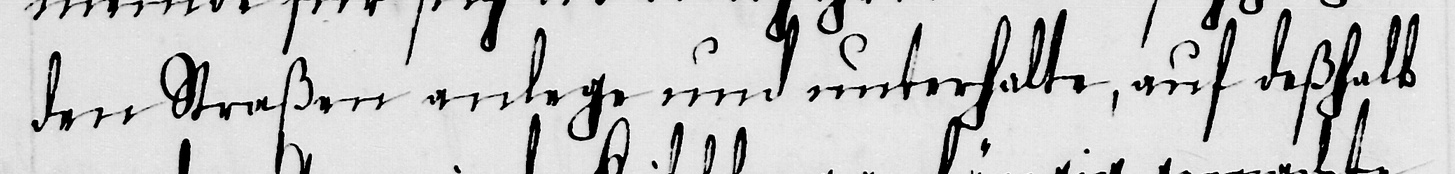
den Straßen anlege und unterhalte, auf deßhalb
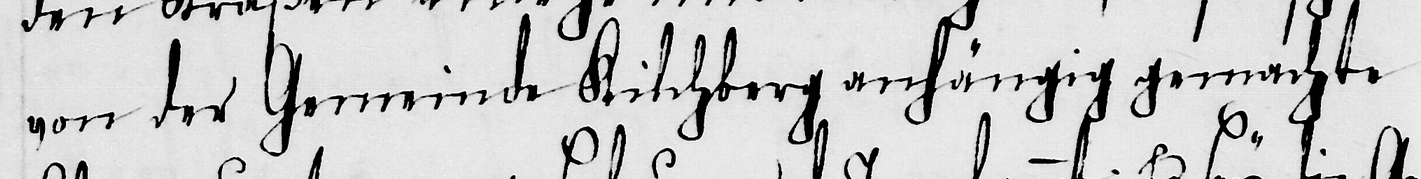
von der Gemeinde Kilchberg anhängig gemachte
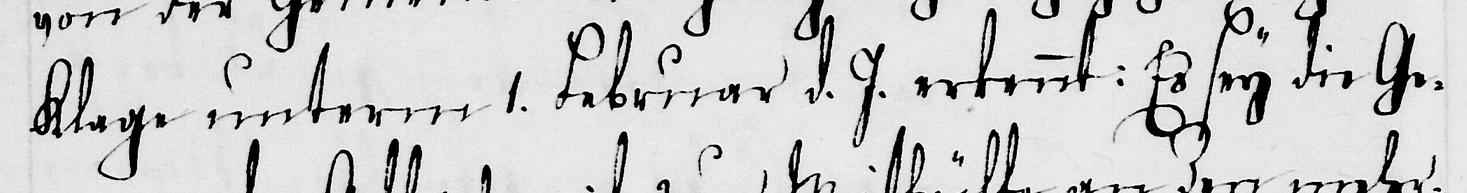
Klage unterm 1. Februar d. J. erkennt: Es sey die Ge¬
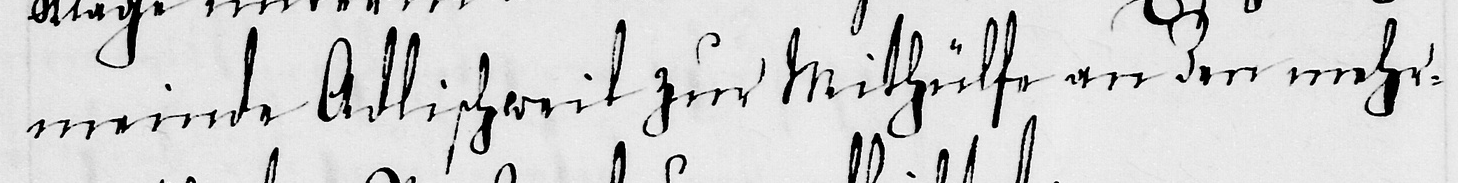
meinde Adlischweil zur Mithülfe an den mehr¬
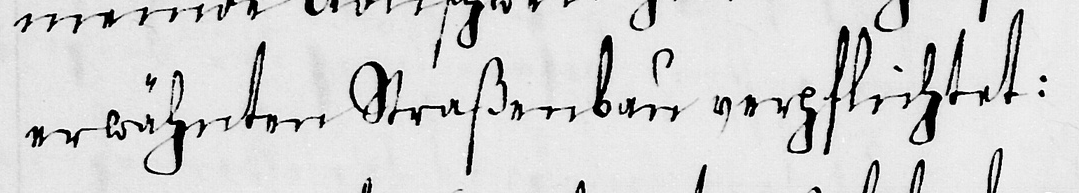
erwähnten Straßenbau verpflichtet:
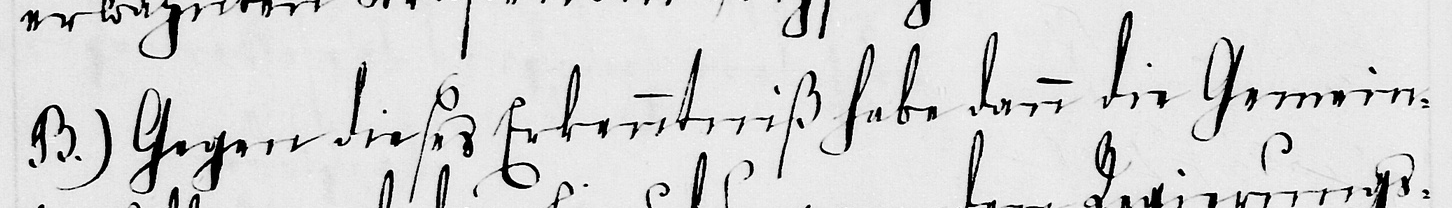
B.) Gegen dieses Erkenntniß habe dann die Gemein¬
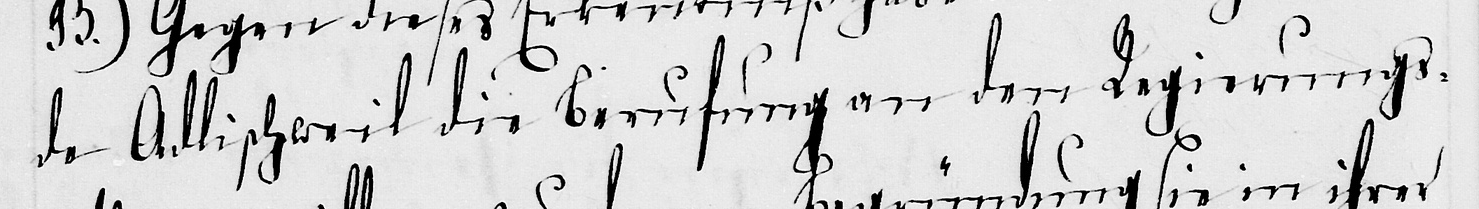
de Adlischweil die Berufung an den Regierungs¬
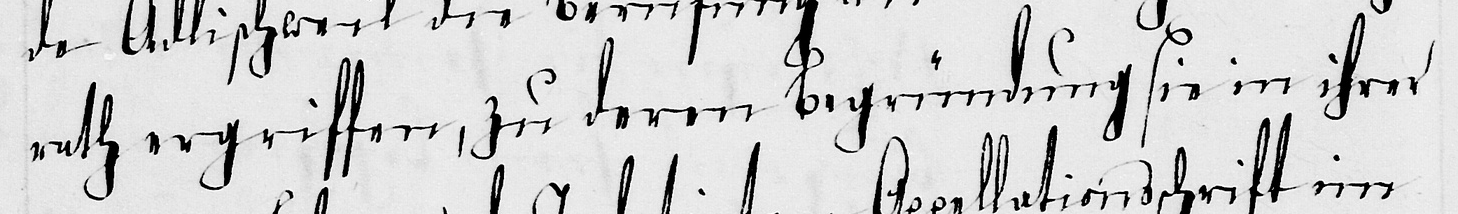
rath ergriffen, zu deren Begründung sie in ihrer
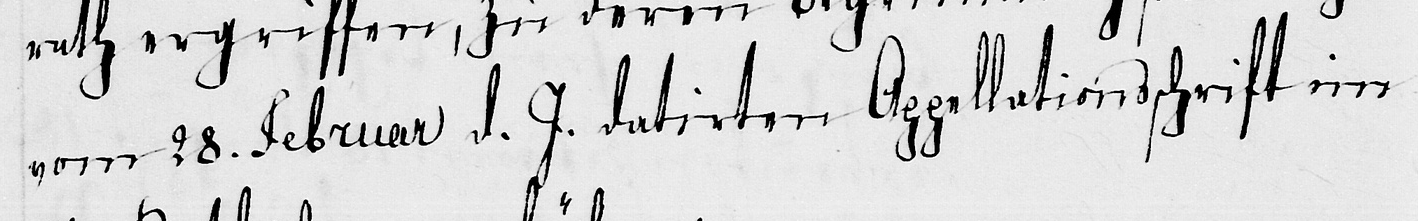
vom 28. Februar d. J. datirten Appellationsschrift im
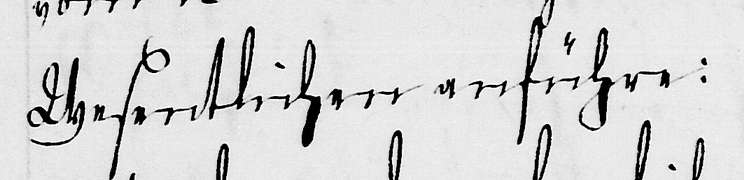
Wesentlichen anführe:
